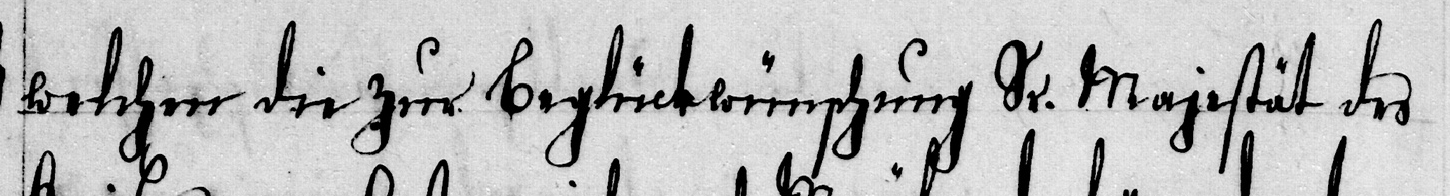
welchen die zur Beglückwünschung Sr. Majestät des
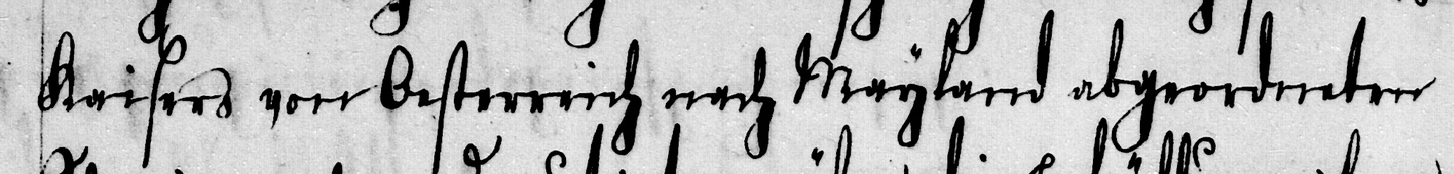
Kaisers von Oesterreich nach Mayland abgeordneten
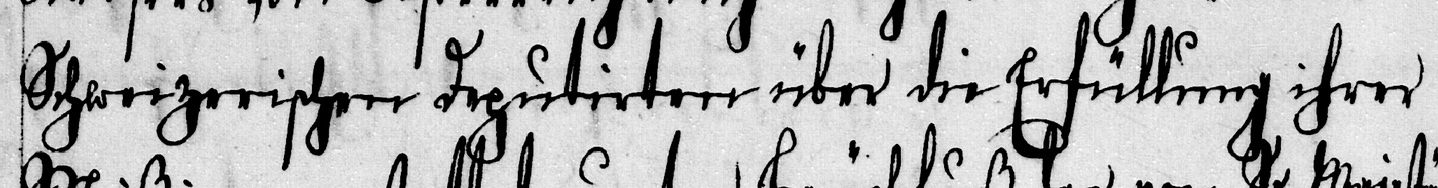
Schweizerischen Deputirten über die Erfüllung ihrer
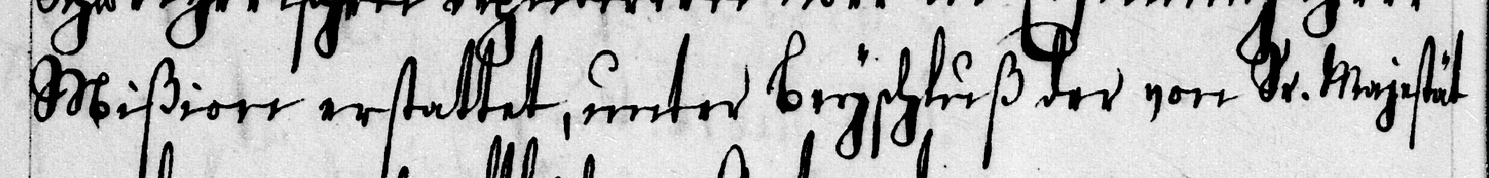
Mißion erstattet, unter Beyschluß der von Sr. Majestät
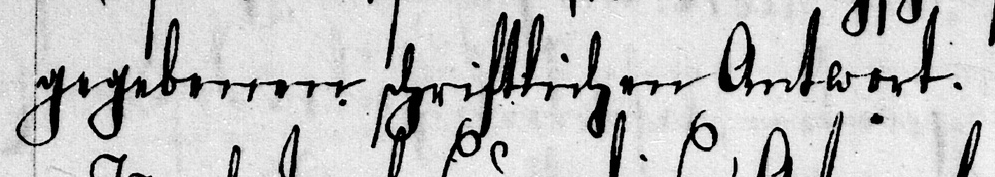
gegebenen schriftlichen Antwort.
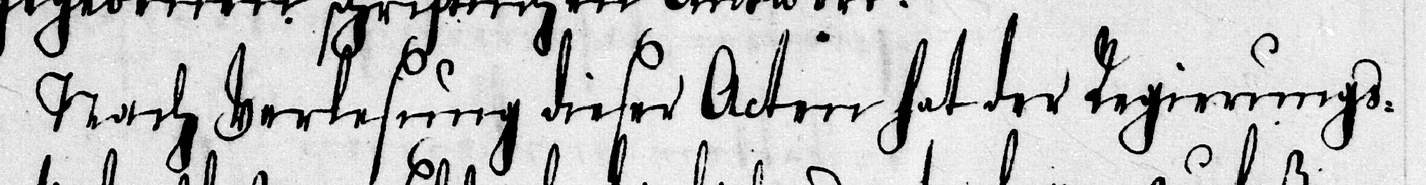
Nach Verlesung dieser Acten hat der Regierungs¬
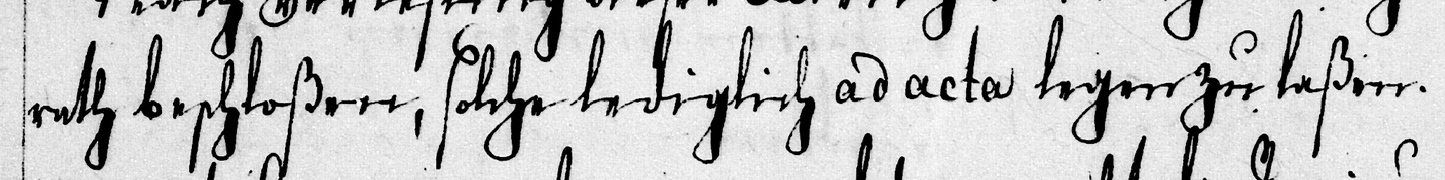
rath beschloßen, solche lediglich ad acta legen zu laßen.
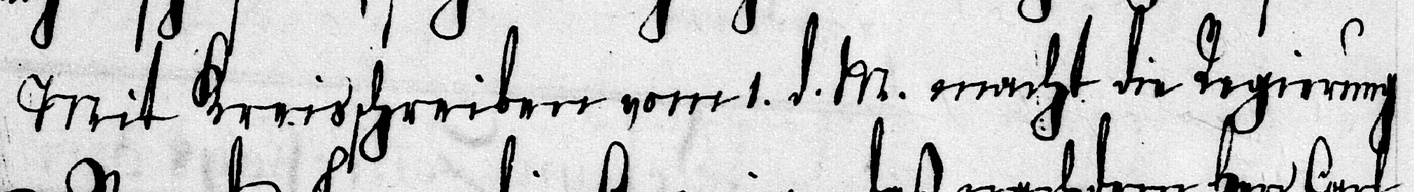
Mit Kreisschreiben vom 1. d. M. macht die Regierung
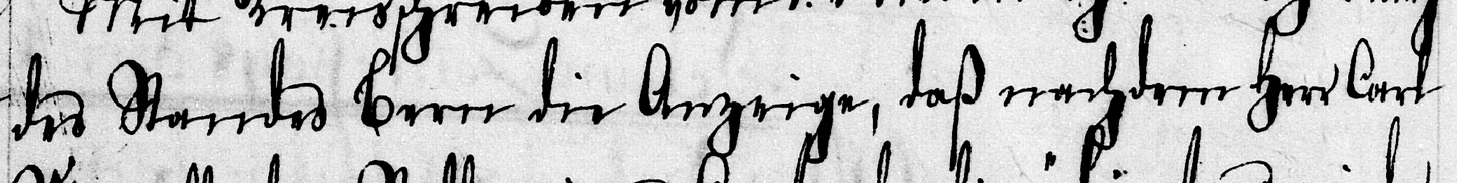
des Standes Bern die Anzeige, daß nachdem Herr Carl
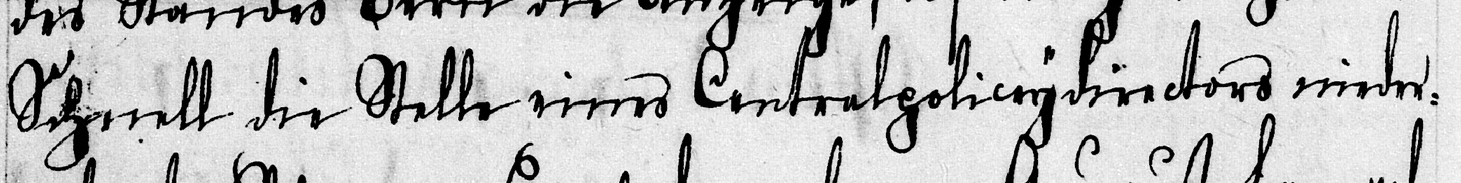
Schnell die Stelle eines Centralpoliceydirectors nieder¬
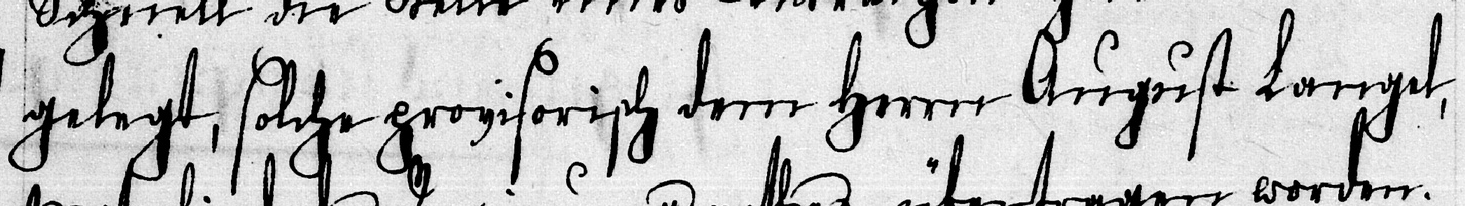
gelegt, solche provisorisch dem Herrn August Langel,
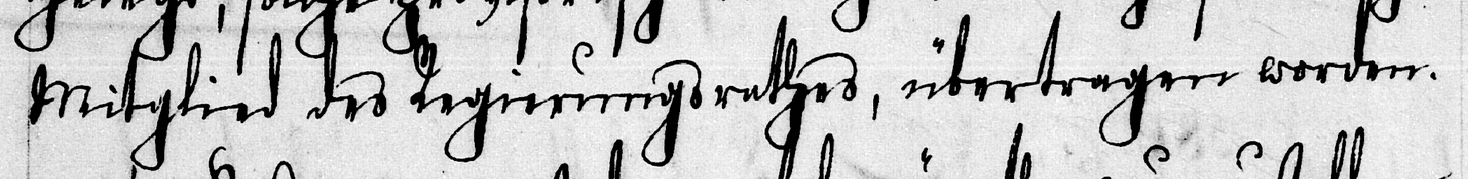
Mitglied des Regierungsrathes, übertragen worden.
